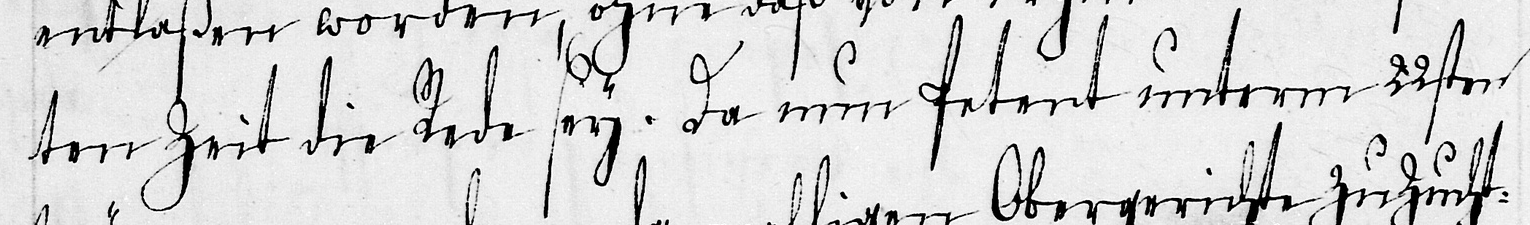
ten Zeit die Rede sey. Da nun Petent unterm 22sten
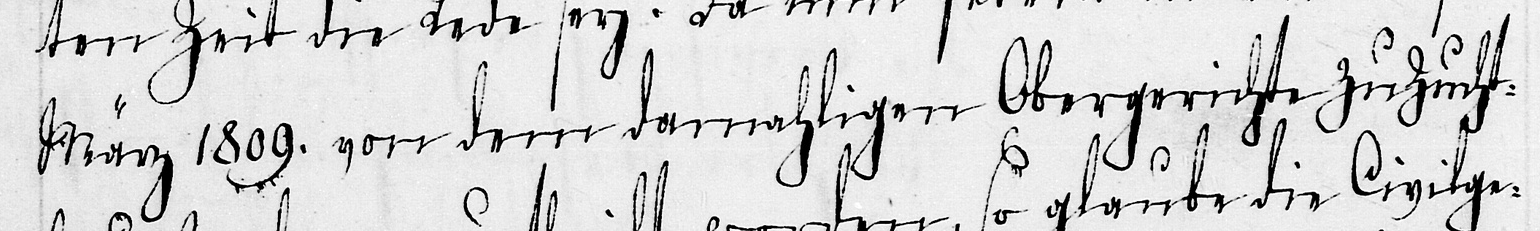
März 1809. von dem damahligen Obergerichte zu Zucht¬
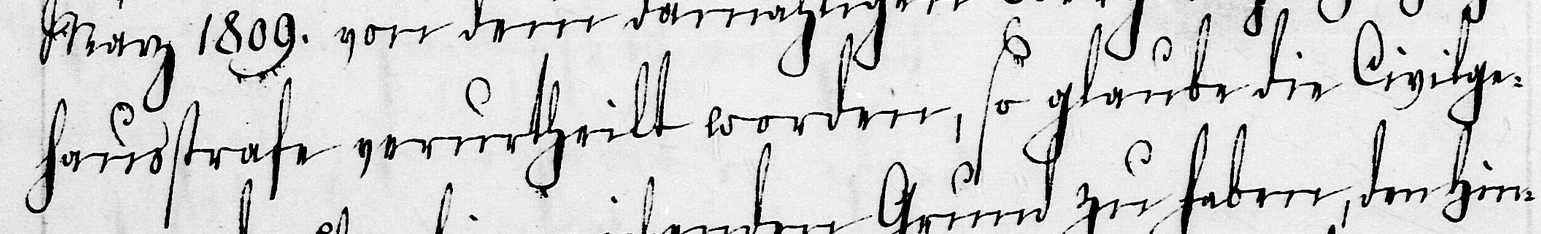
hausstrafe verurtheilt worden, so glaube die Civilge¬
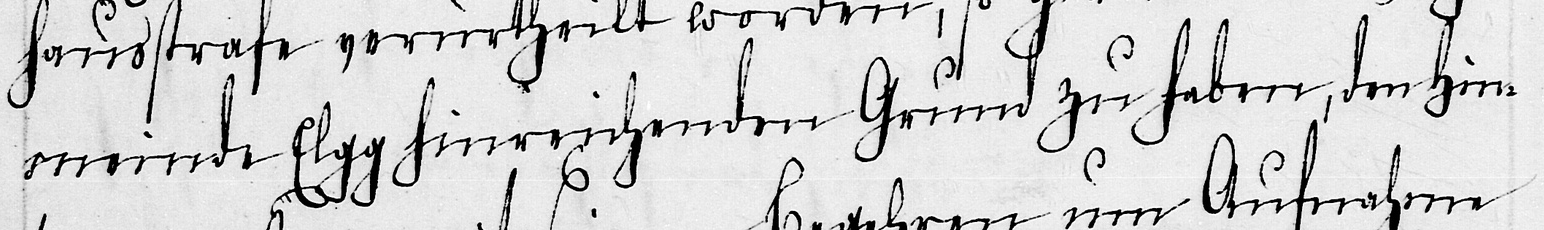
meinde Elgg hinreichenden Grund zu haben, den Hin¬
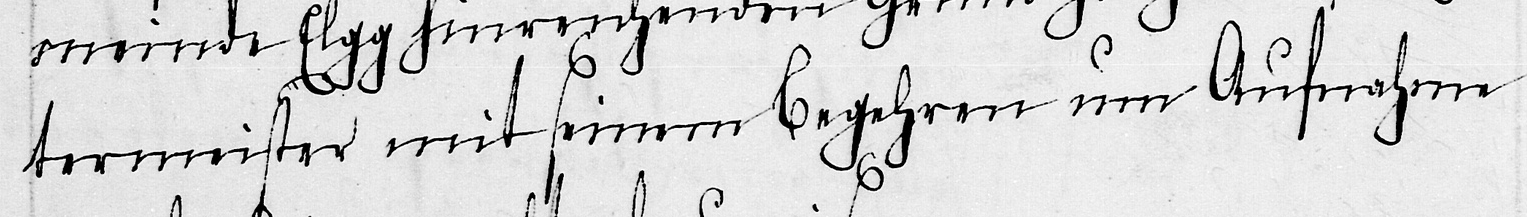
termeister mit seinem Begehren um Aufnahme
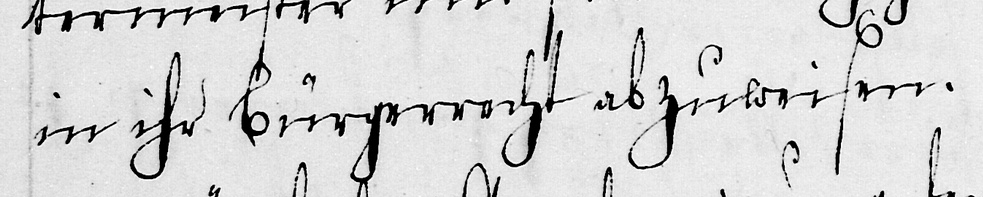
in ihr Bürgerrecht abzuweisen.
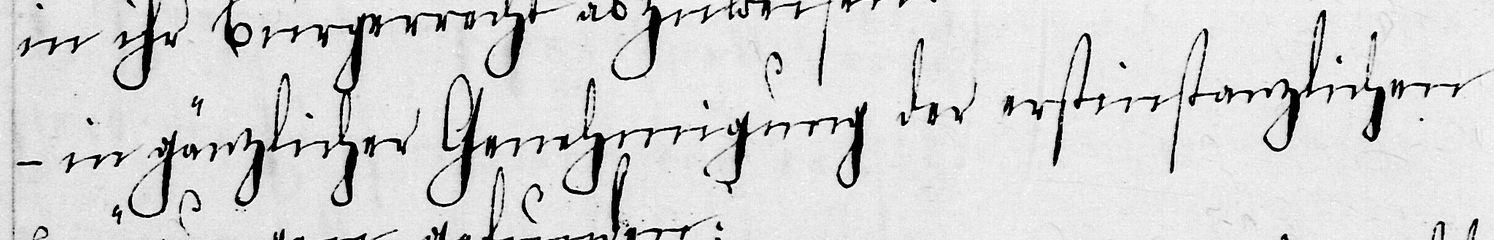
– in gänzlicher Genehmigung der erstinstanzlichen
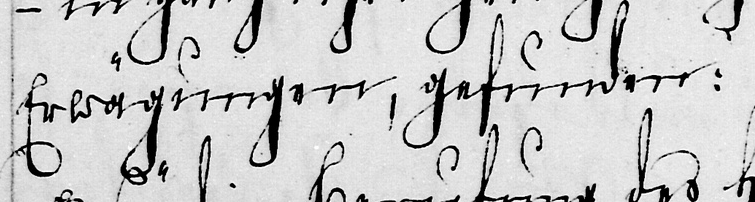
Erwägungen, gefunden:
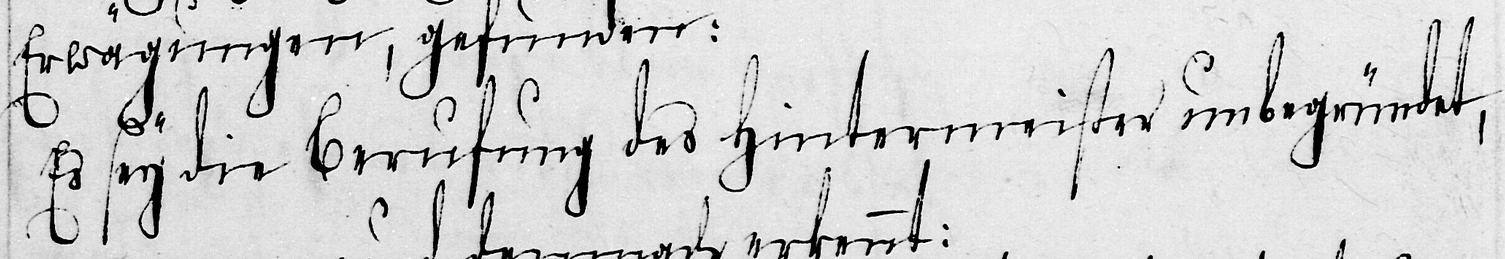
Es sey die Berufung des Hintermeister unbegründet,
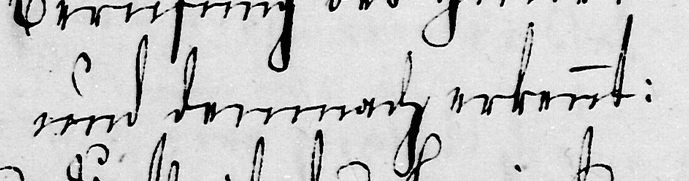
und demnach erkennt:
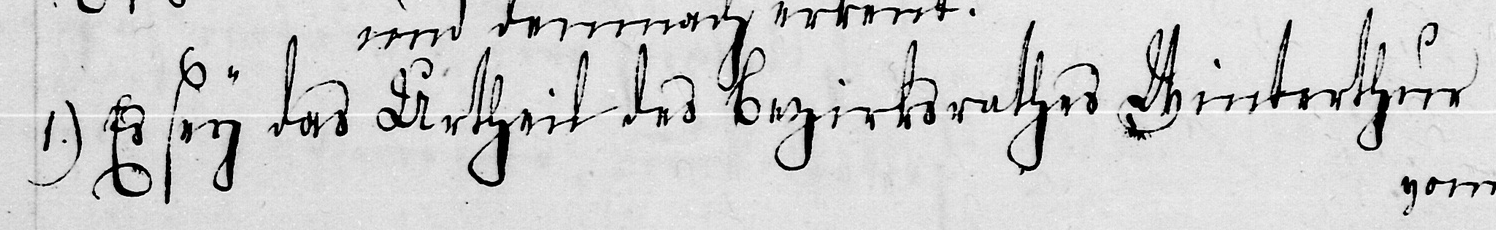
1.) Es sey das Urtheil des Bezirksrathes Winterthur
